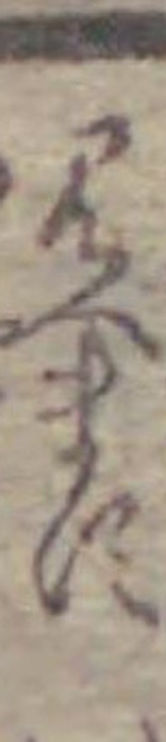見へます
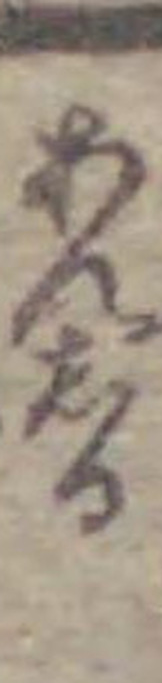あんしる
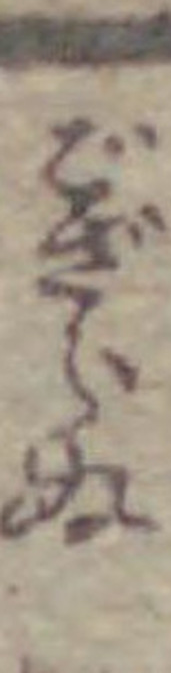ござらぬ
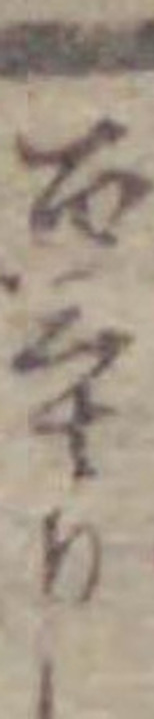百三十り
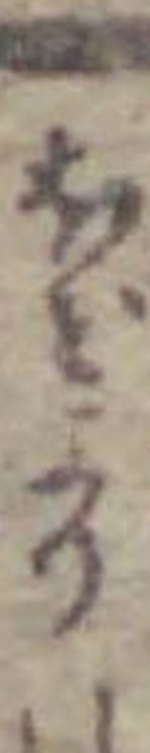ほどより
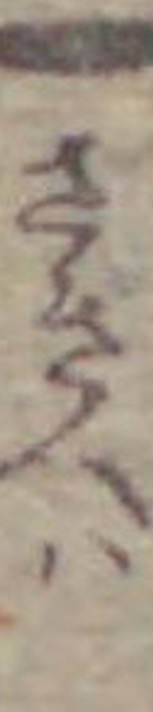さきへは
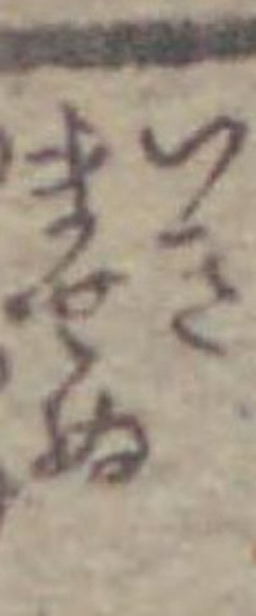ませぬ
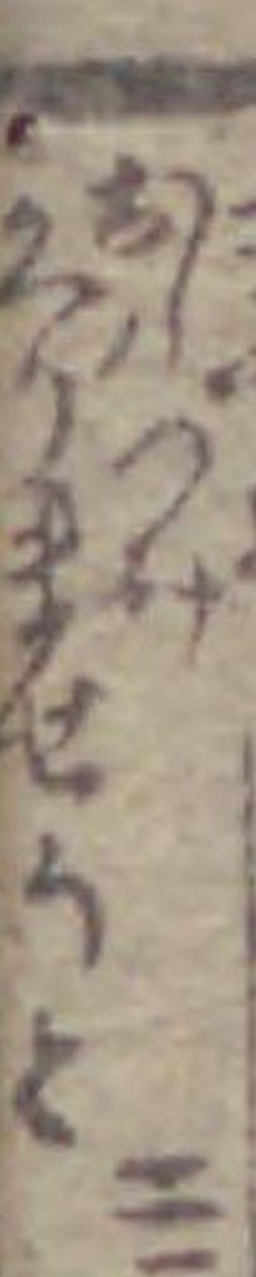かへりませうと
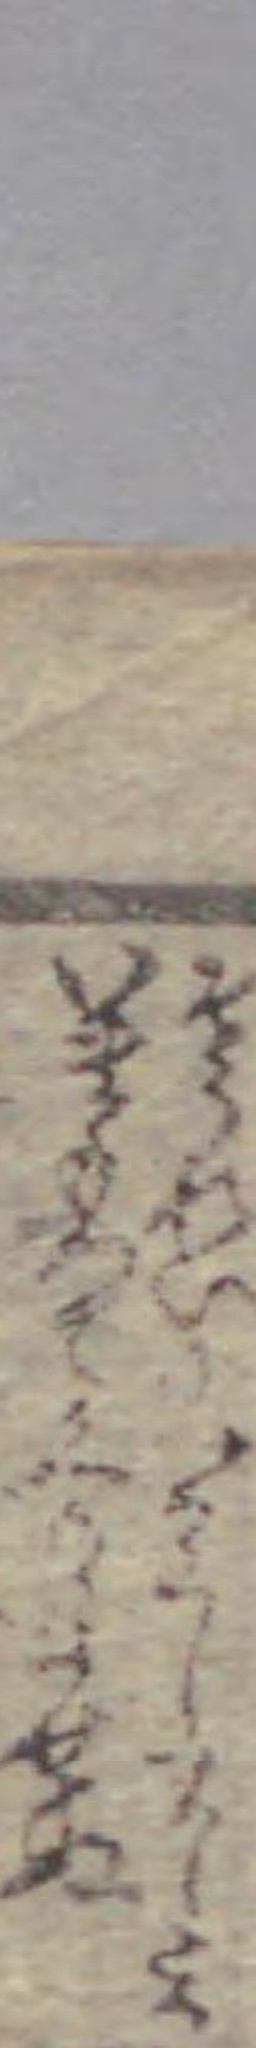いまもつてかへりませぬ
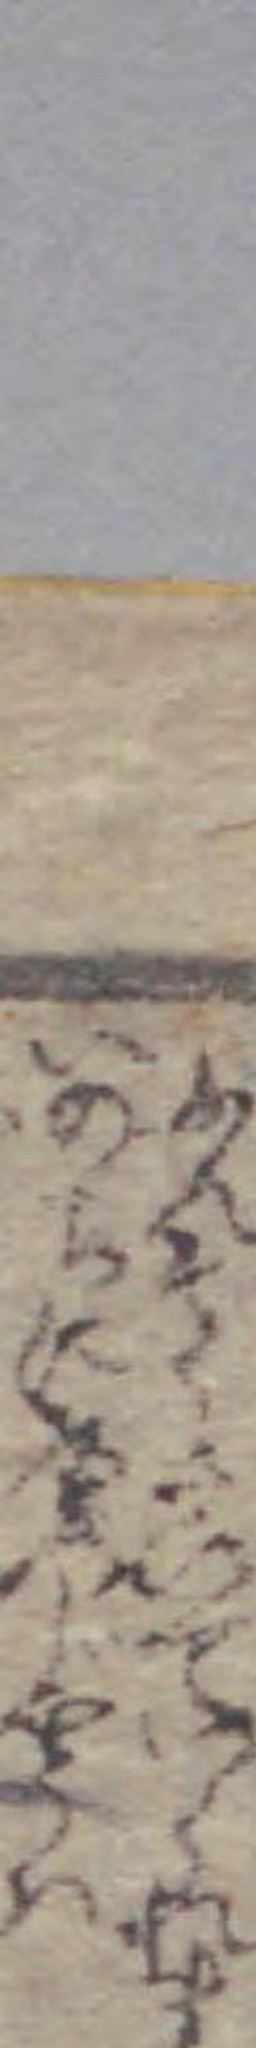いのちにぢやうは
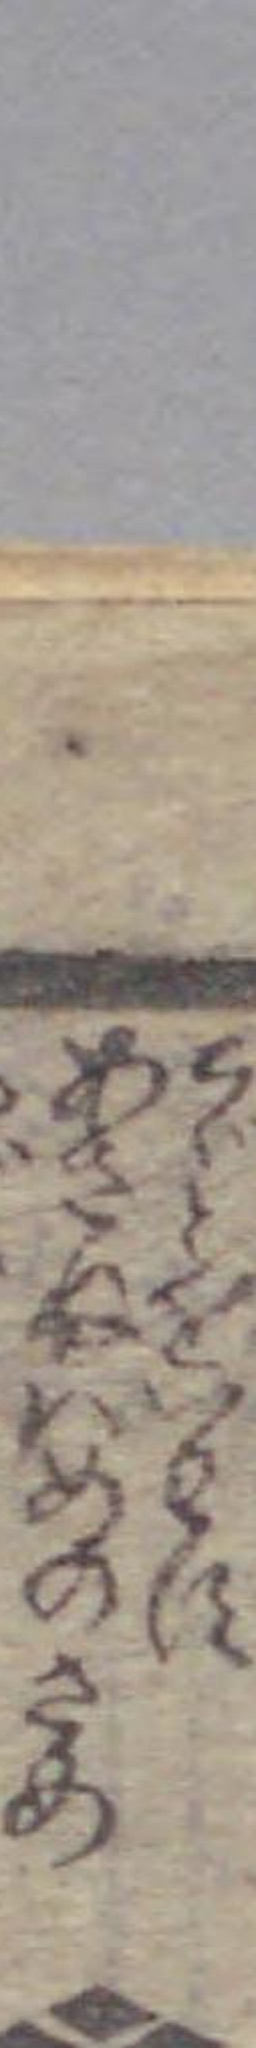あさねはめのさめ
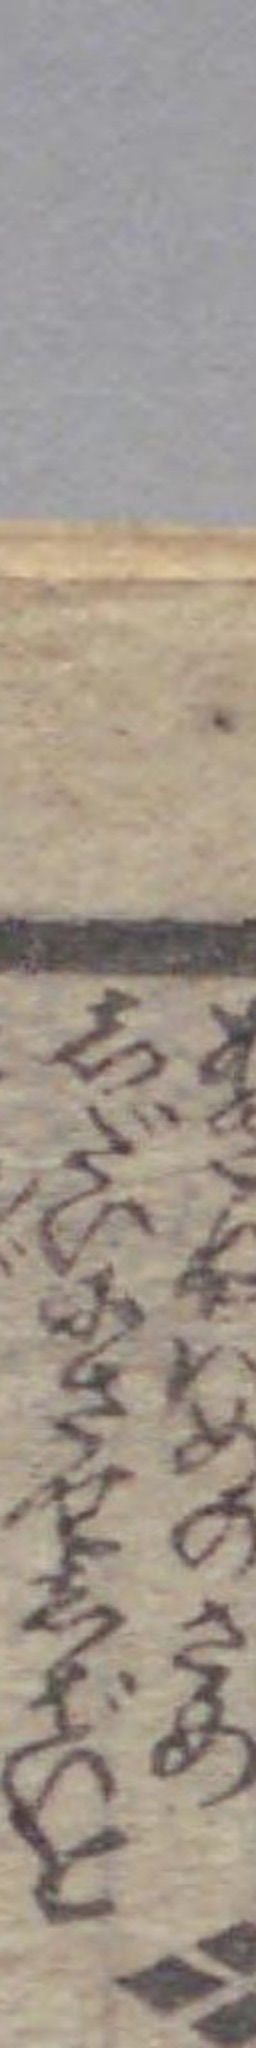しだいにさせしばいを
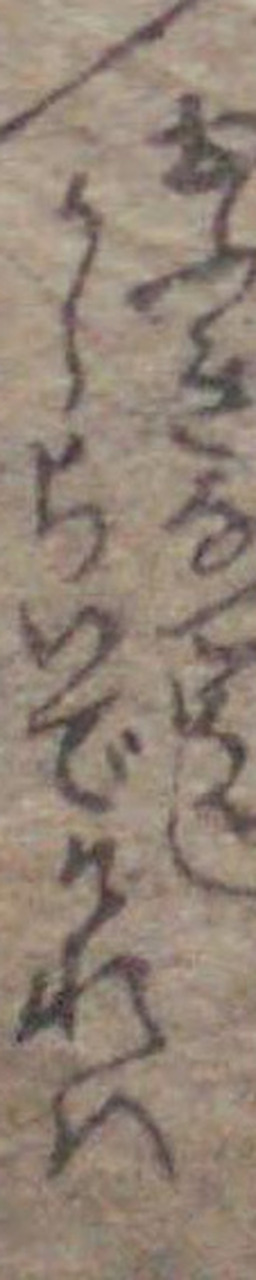うらよりいでけれは
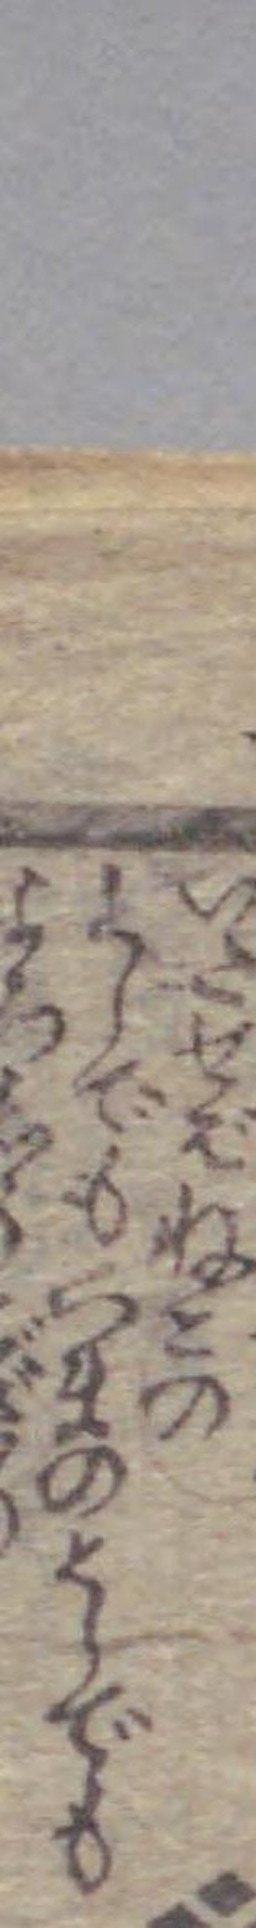としでもくまのとしでも
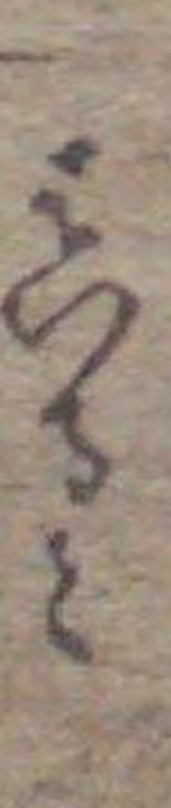はいると

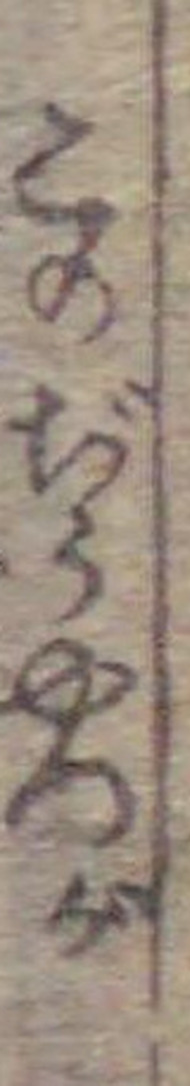このぢうやつが
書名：見通占 : 3巻
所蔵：国立国会図書館 National Diet Library, JAPAN
